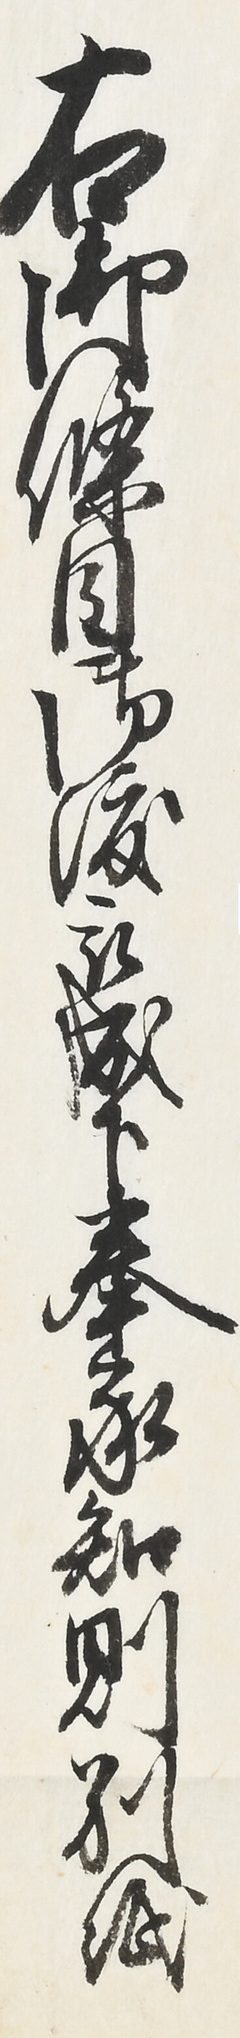右御條目御渡被成下奉承知則別紙
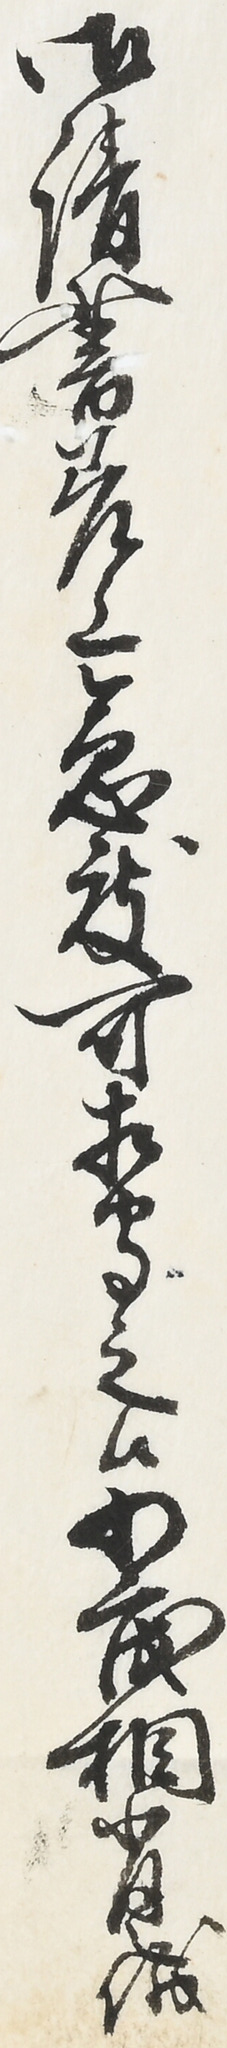請書差上急度可相守之候少茂相背儀

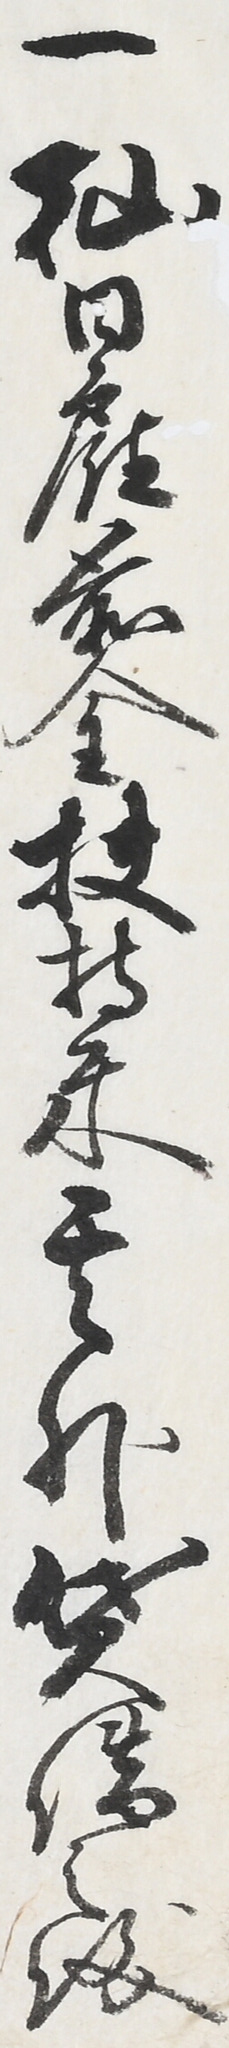一杣日雇前金扶持米其外貸借之儀
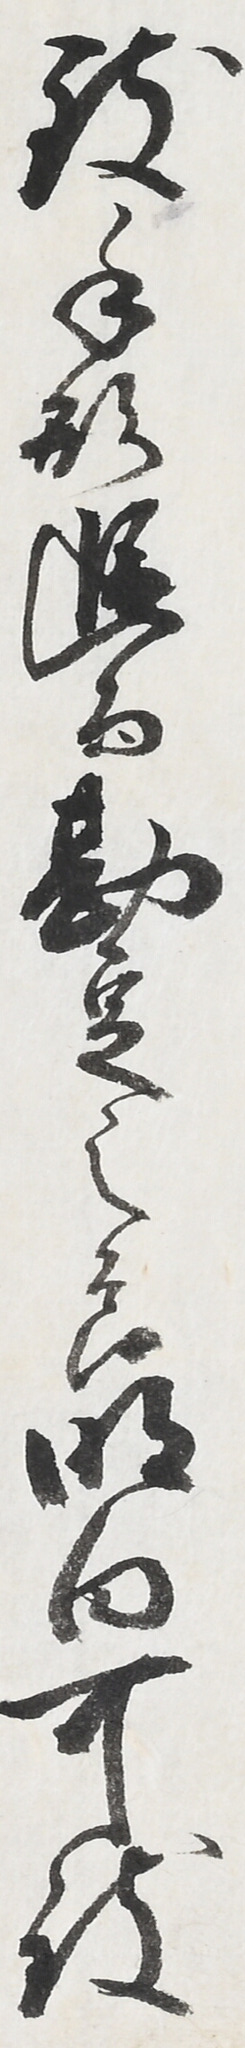致手形追而勘定之節明白可致
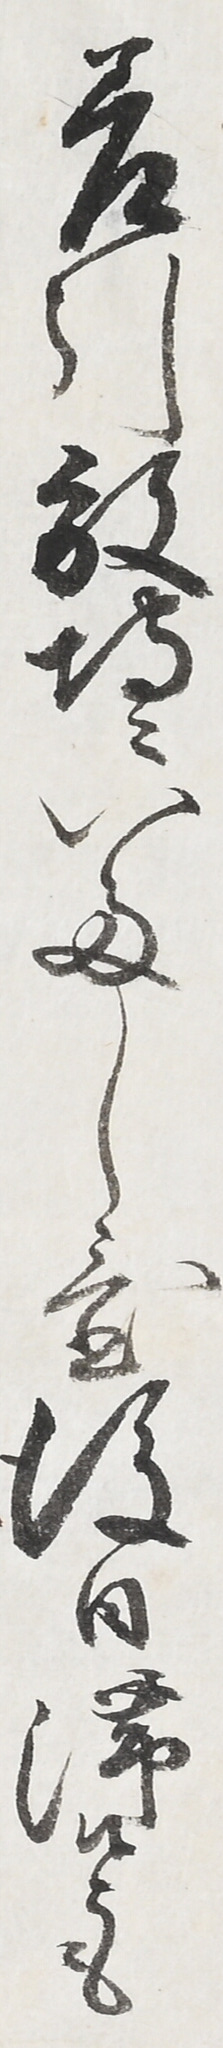差引放埒ニいたし置後日滞候とも
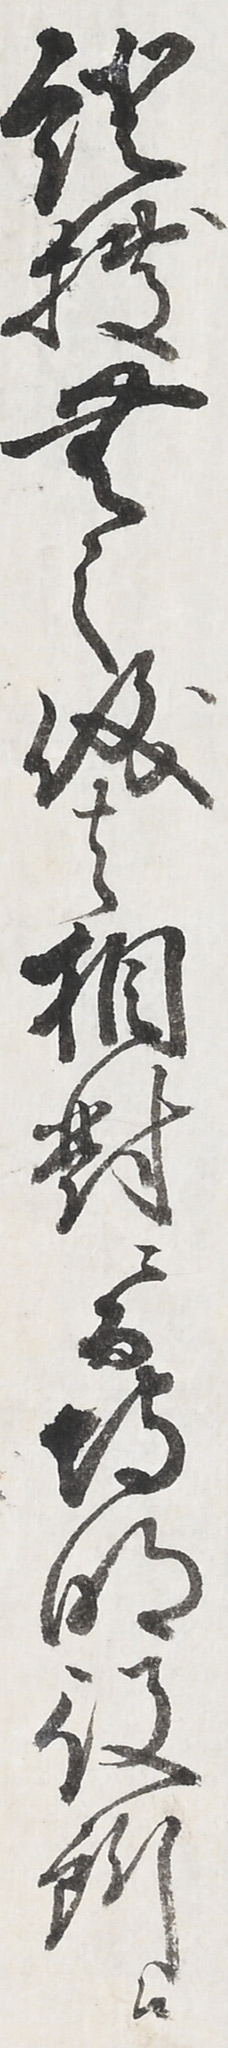証拠無之儀者相対ニ而埒明役所江
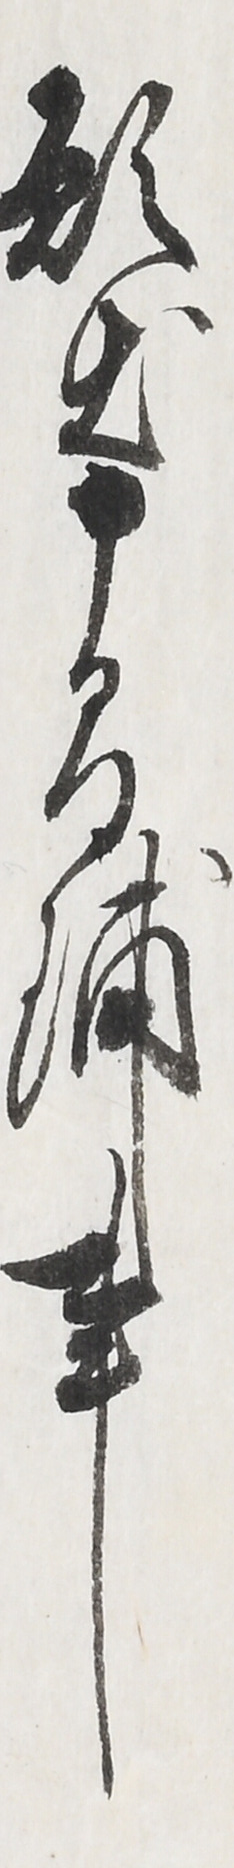願出申間敷事
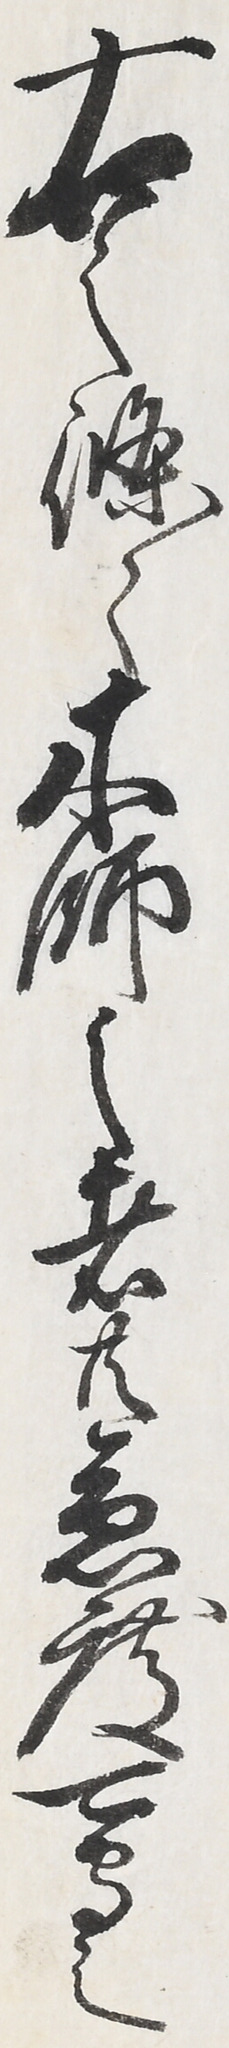右之條々木師之者共急度可守之
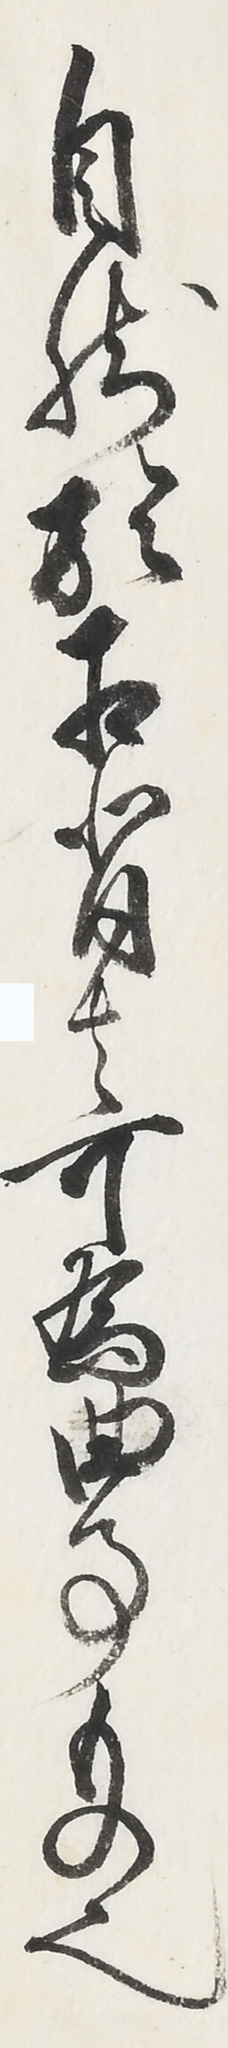自然於相背者可為曲事もの也
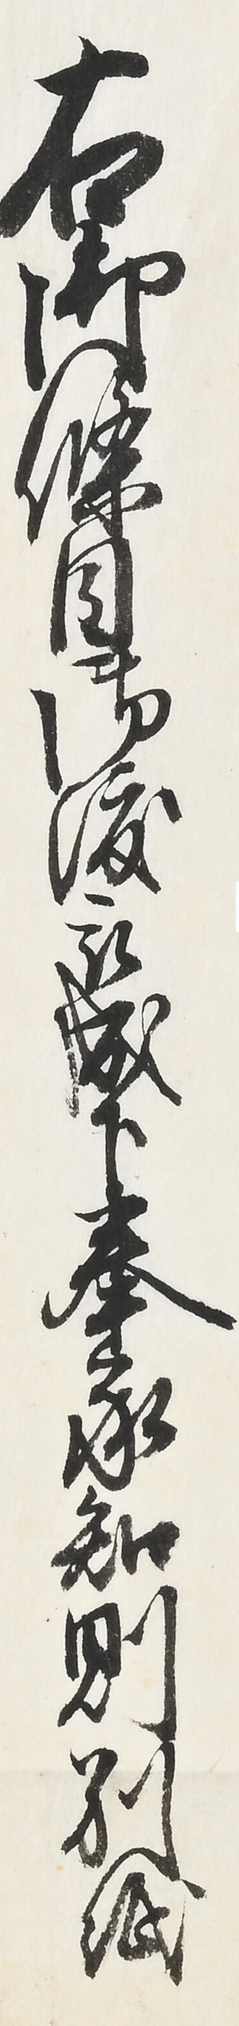右御條目御渡被成下奉承知則別紙
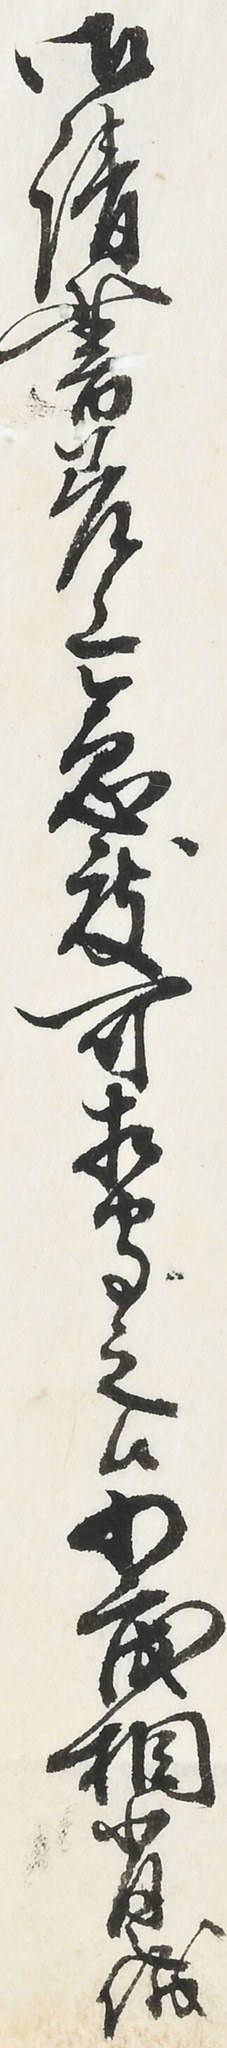請書差上急度可相守之候少茂相背儀

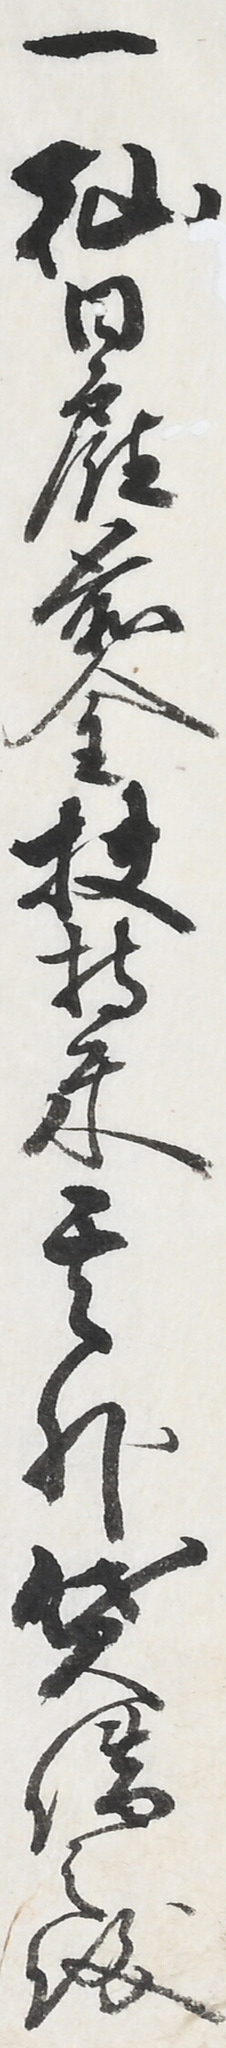一杣日雇前金扶持米其外貸借之儀
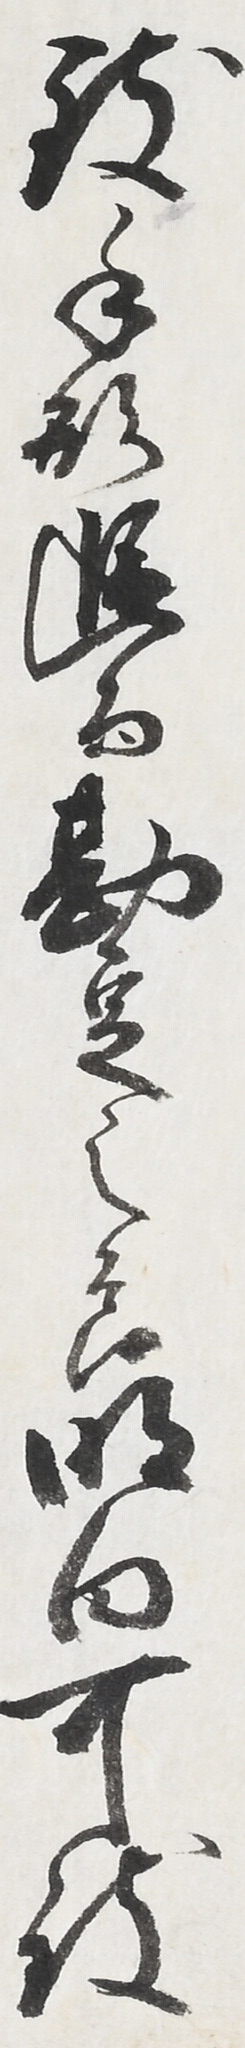致手形追而勘定之節明白可致
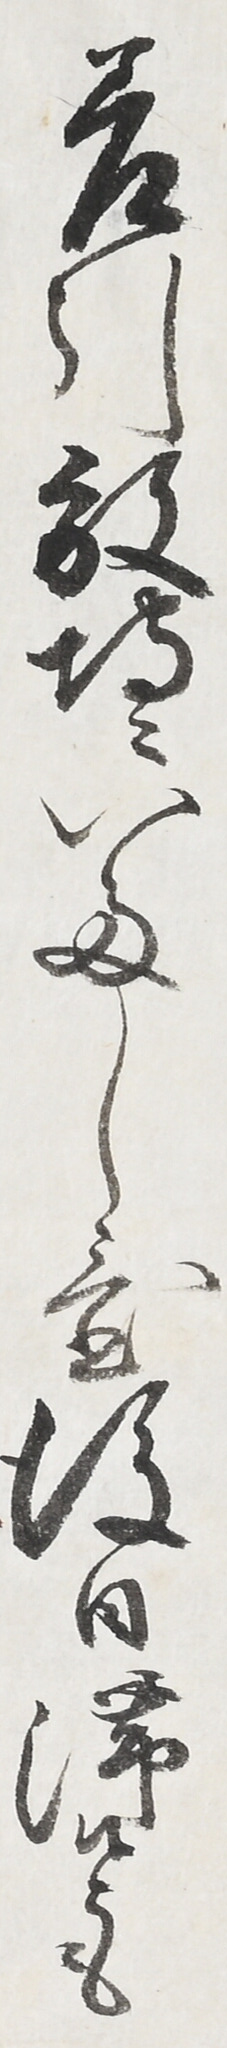差引放埒ニいたし置後日滞候とも
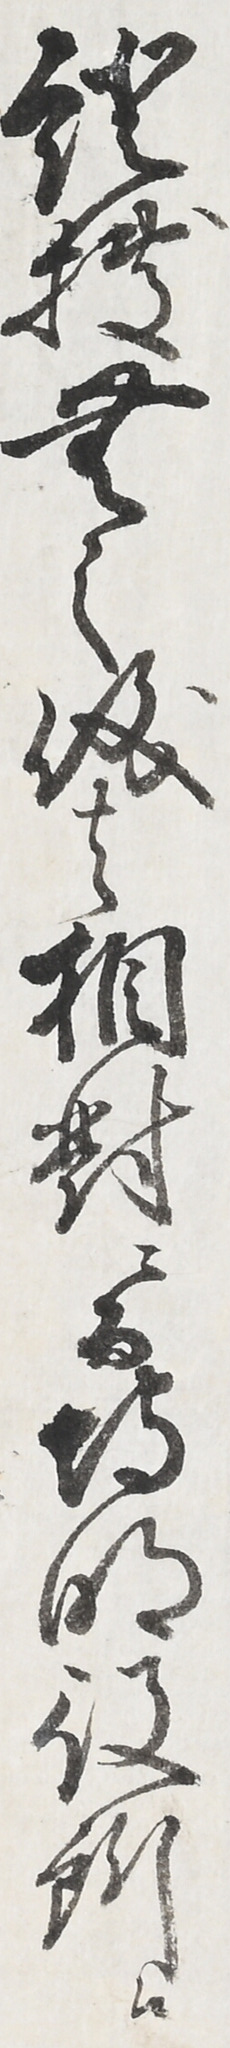証拠無之儀者相対ニ而埒明役所江
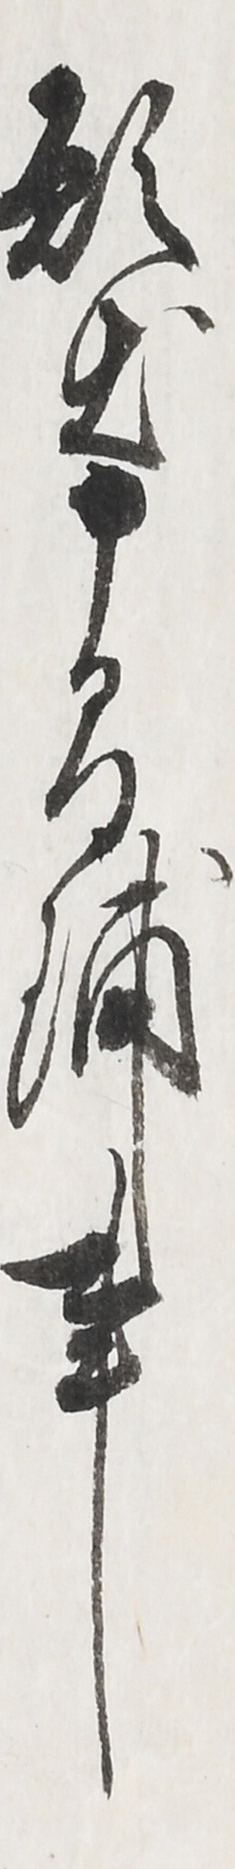願出申間敷事
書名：小白木條目請書并判取帳
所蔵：伊那市立高遠町図書館・合同会社AMANE
